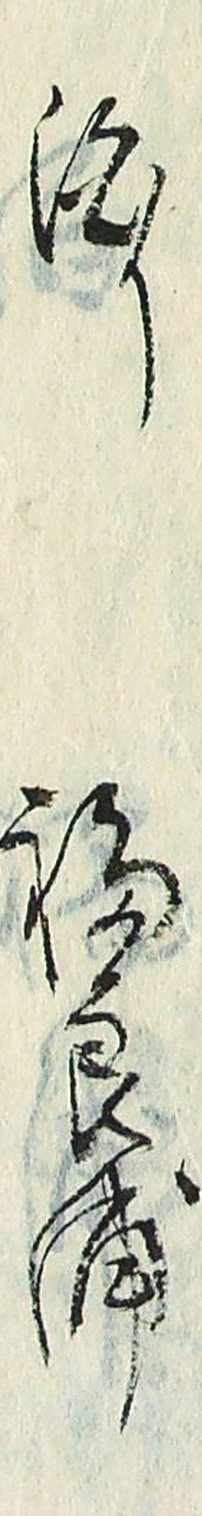泊り福良浦

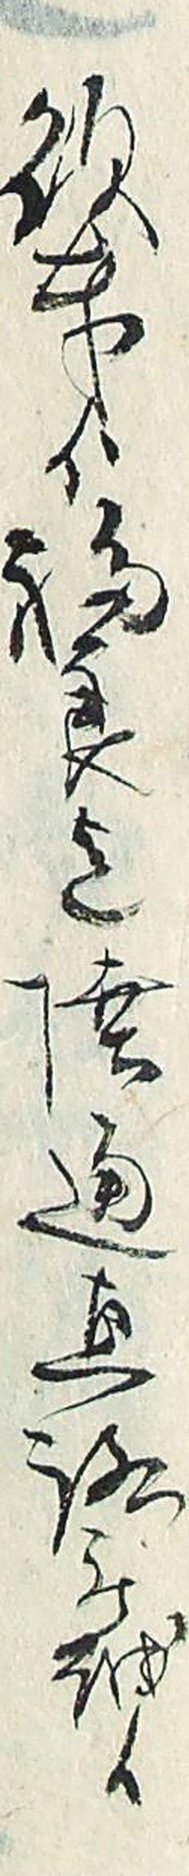須本ゟ福良迄陸通直路罷越候
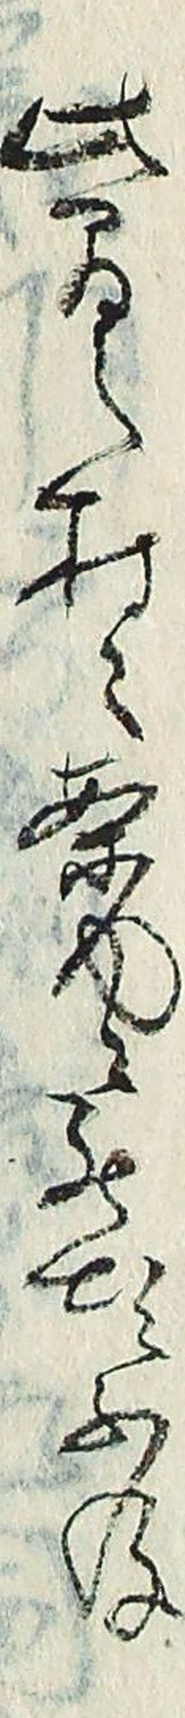此間之村々案内に罷出の不及
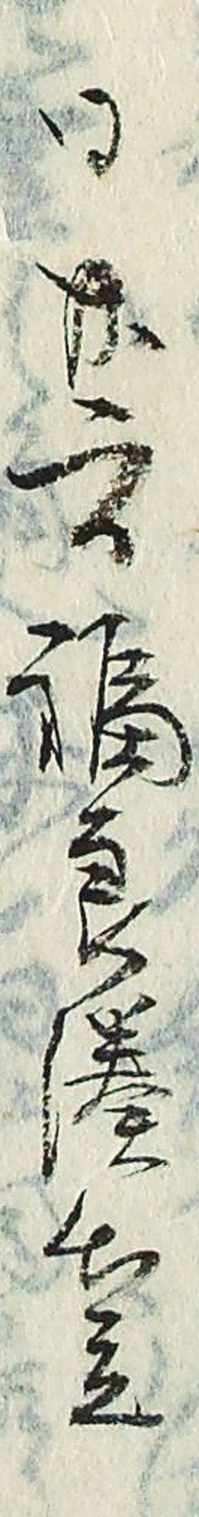同廿二日福良湊出立
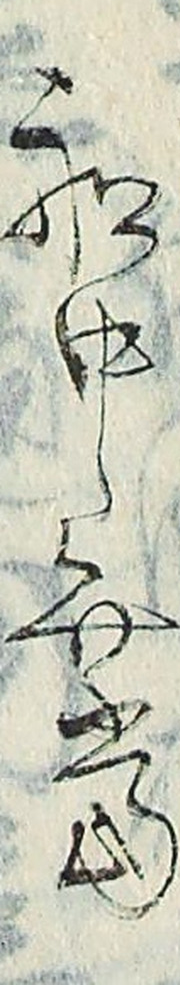船中弁当
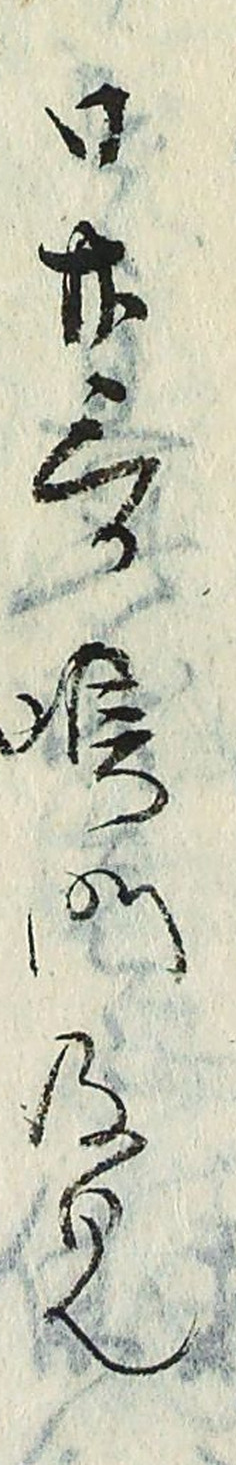同廿三日鳴門及見
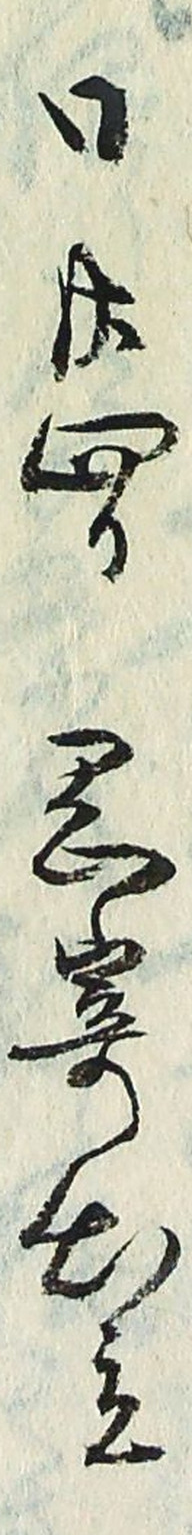同廿四日岡崎出立
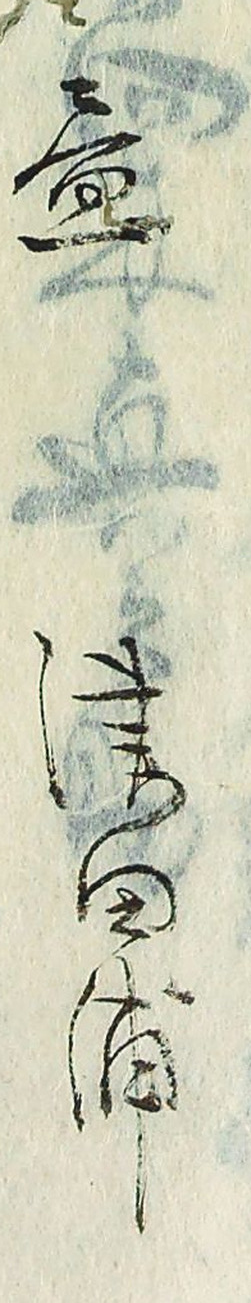昼津田浦
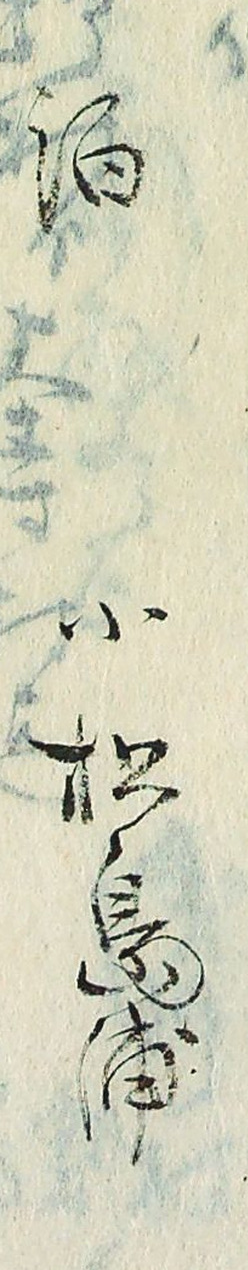泊小松島浦
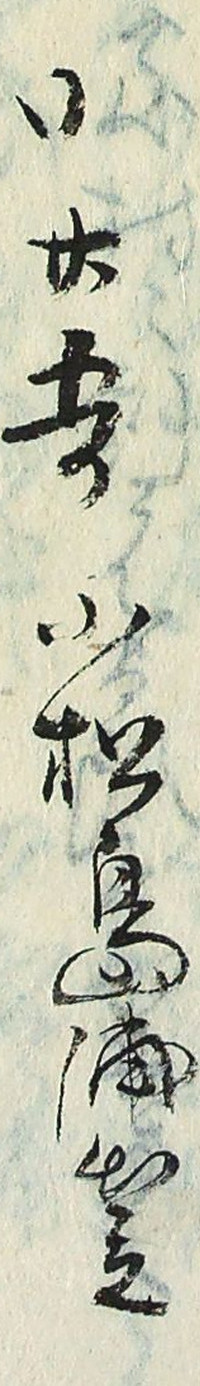同廿五日小松島浦出立
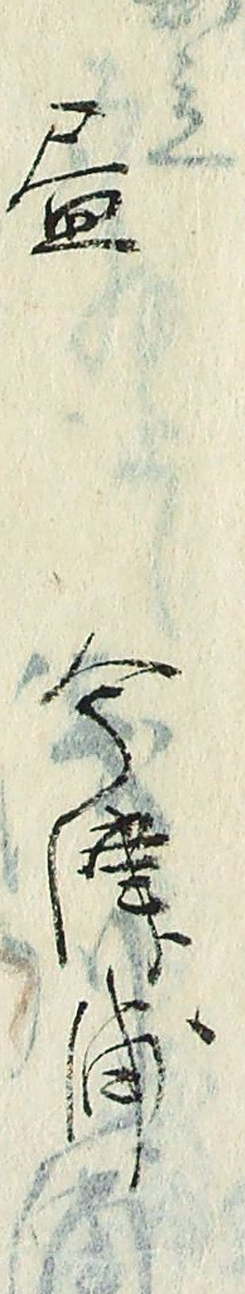昼今津浦
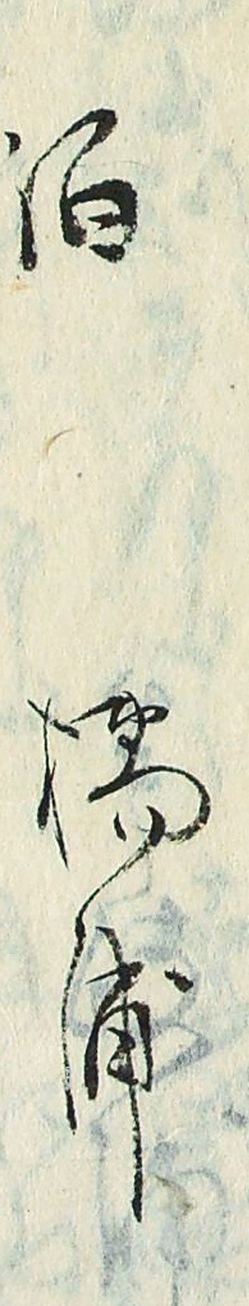泊橘浦

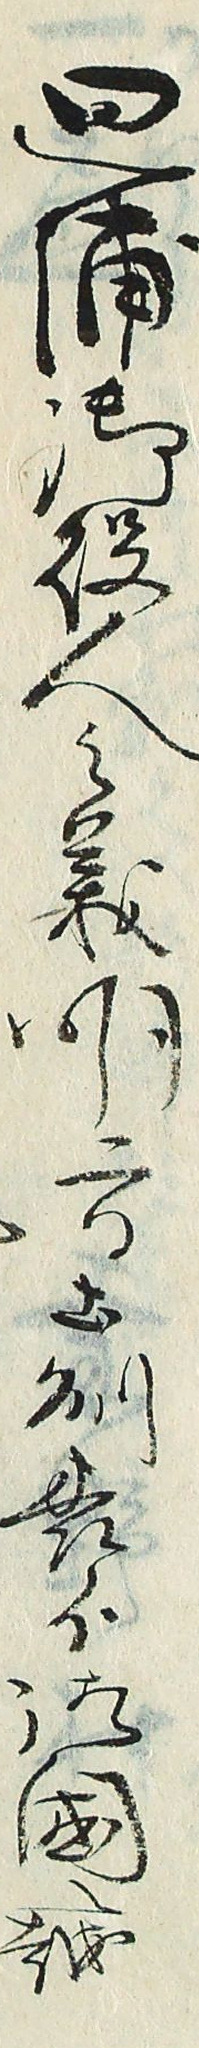廻浦御役人之義明二日土州表ゟ御国へ越
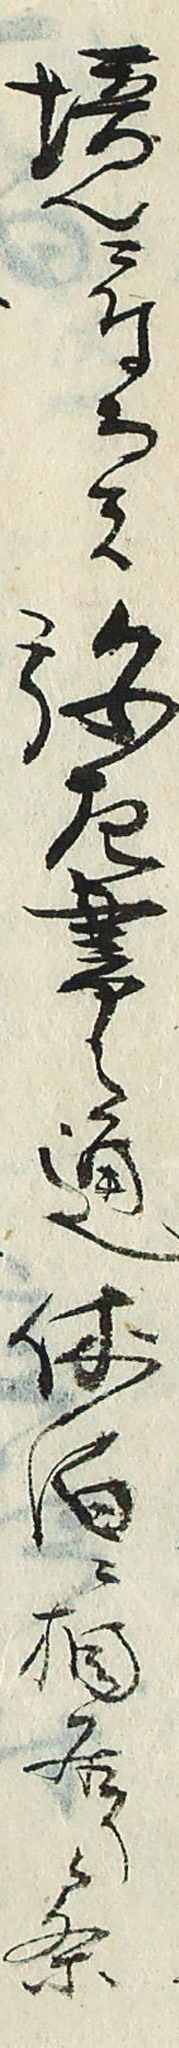境に付ては弥左書之通休泊に相居り候条
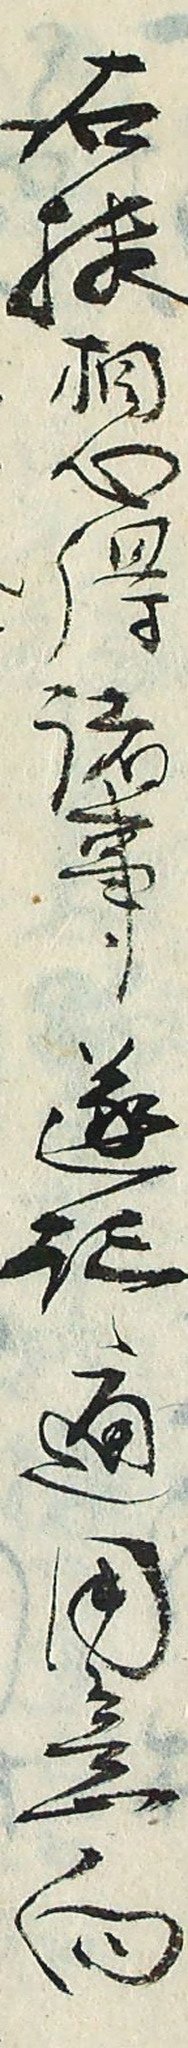右様相心得諸事遂配之通用意向
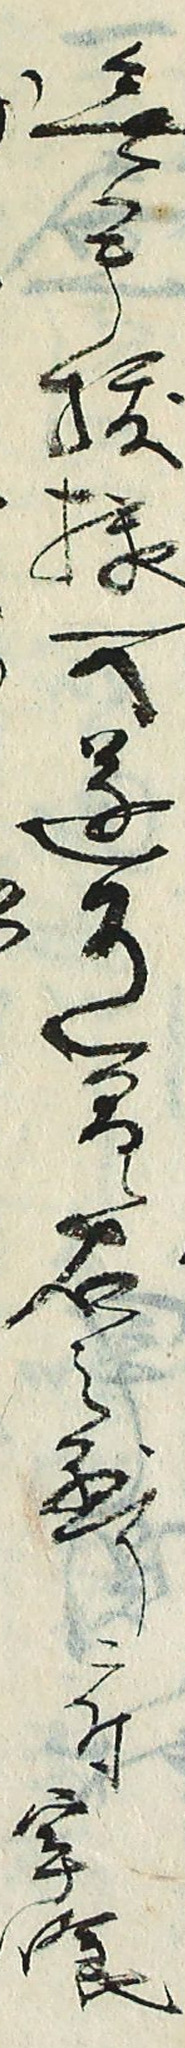無手抜様可遂了簡候右之懸りに付宍喰
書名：公辺御役人為御廻浦御立越諸御用一巻
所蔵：鳴門教育大学 Naruto University of Education
